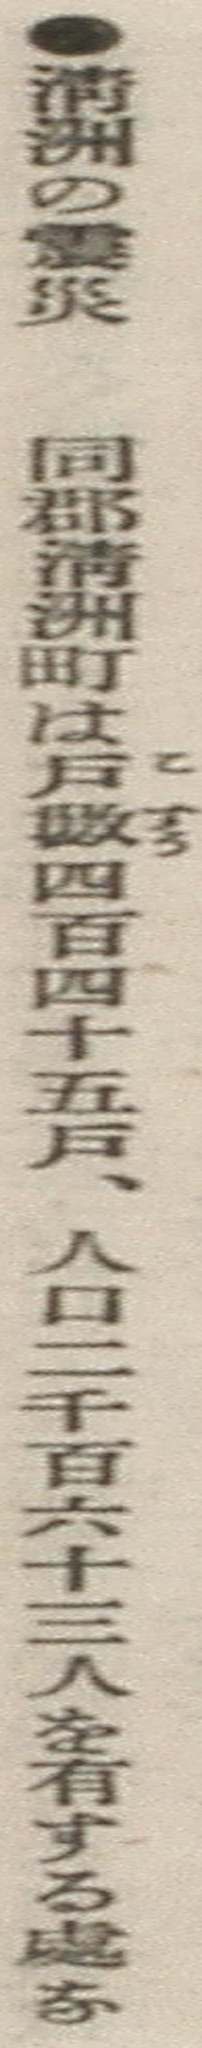●清州の震災同郡清洲町は戸数こすう四百四十五戸、人口千百六十三人を有する処な

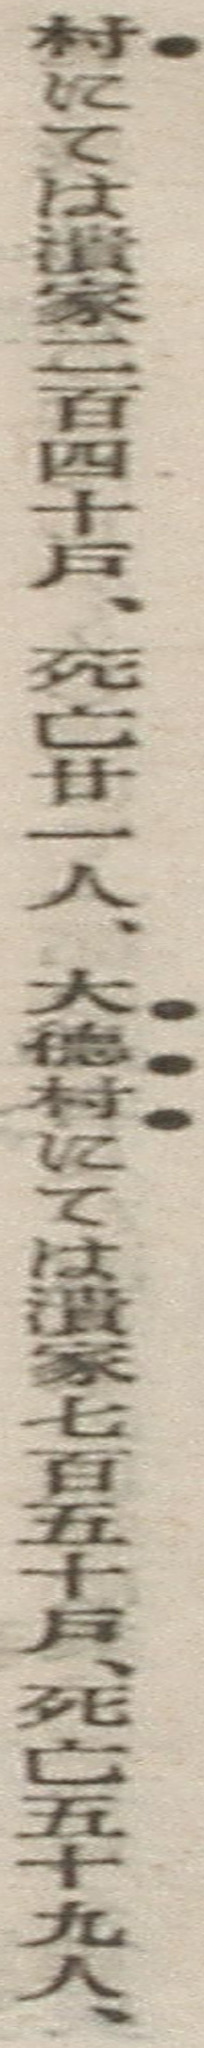村●にては潰家二百四十戸、死亡廿一人、大徳村●●●にては潰家七百五十戸、死亡五十九人、
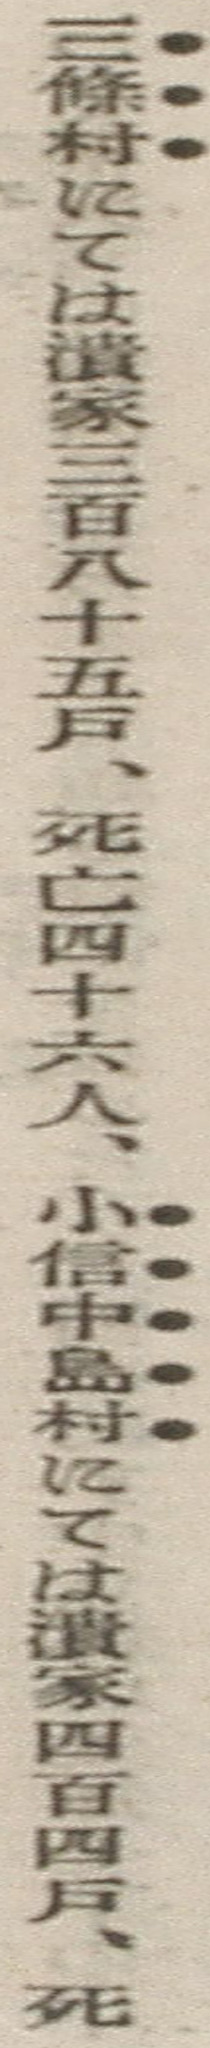三條村●●●にては潰家三百八十五戸、死亡四十六人、小信中島村●●●●●にては潰家四百四戸、死
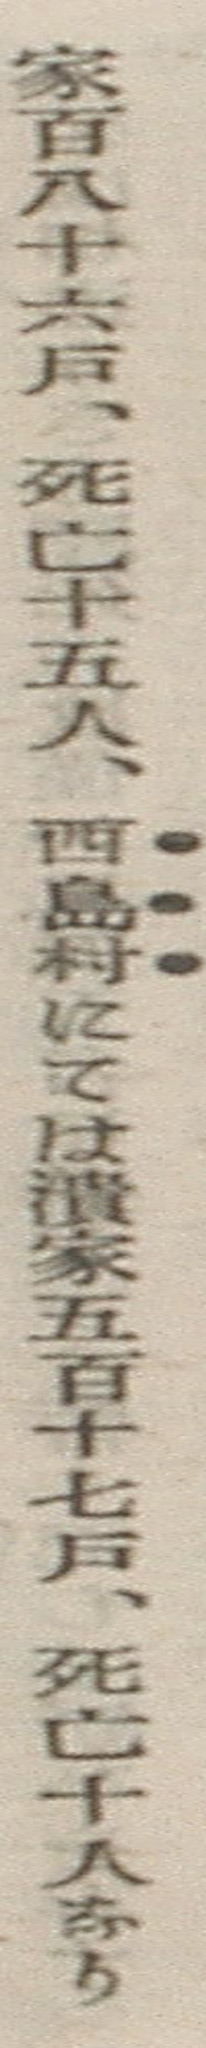家百八十六戸、死亡十五人、西島村●●●にては潰家五百十七戸、死亡十人なり

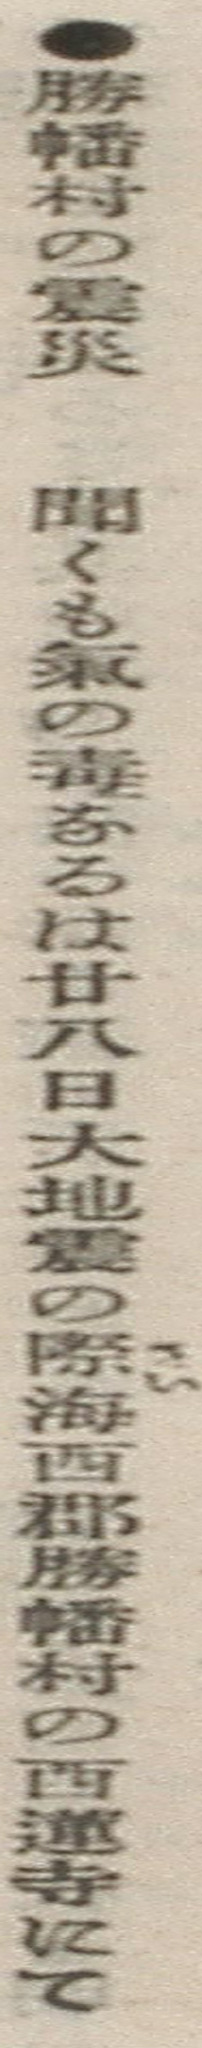●勝幡村の震災聞くも気の毒なるは廿八日大地震の際さい海西郡勝幡村の西蓮寺にて
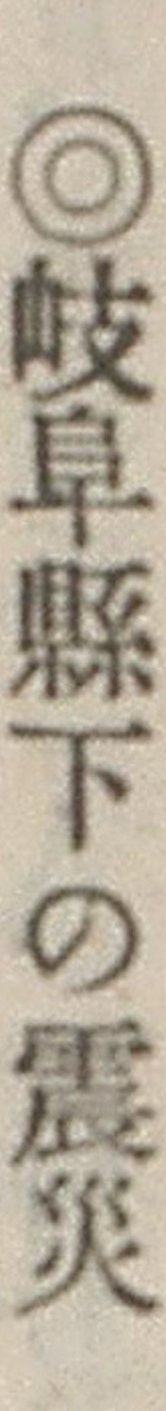◎岐阜県下の震災

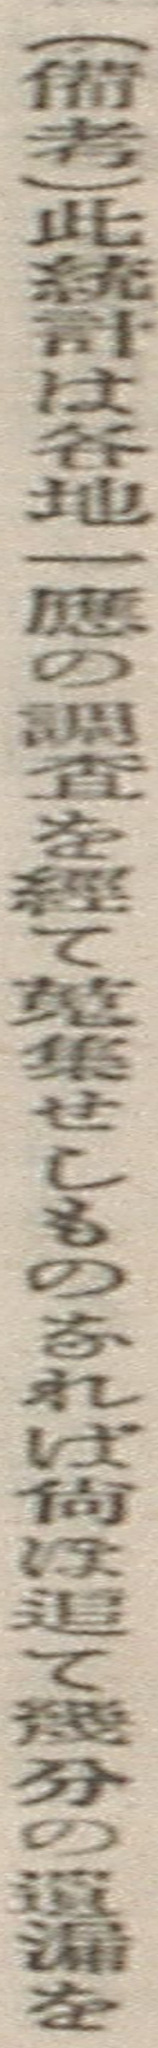此統計は各地一応の調査を経て蒐集せしものなれば尚ほ追て幾分の遺漏を
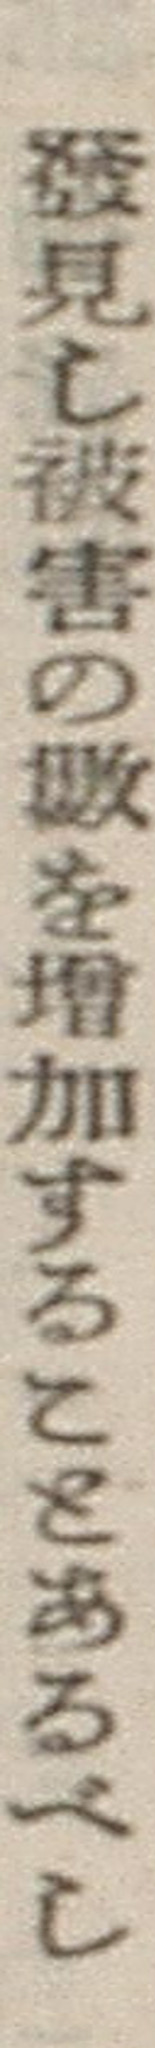発見し被害の数を増加することあるべし
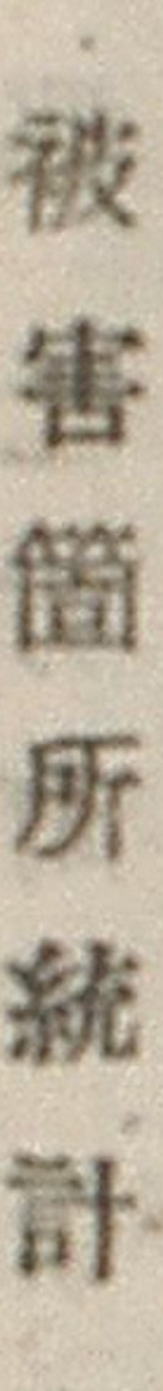被害箇所統計
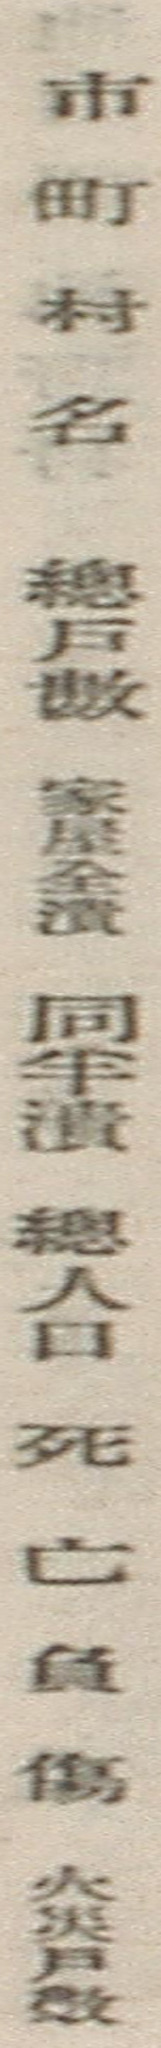市町村名総戸数家屋全潰同半潰総人口死亡負傷火災戸数
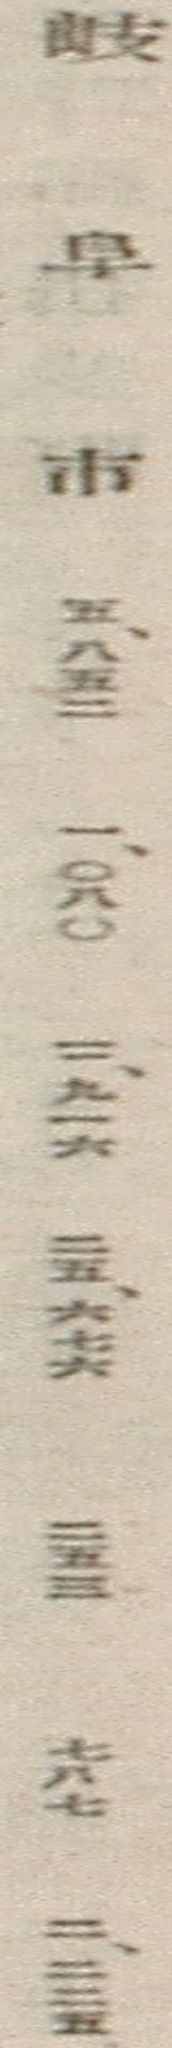岐阜市五、八五二一、〇八〇二、九一六二五、六七六二五三五八七二、二二五
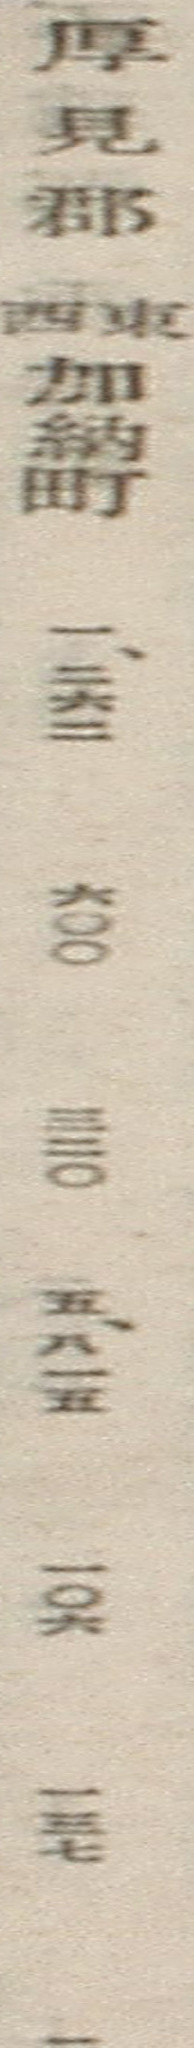厚見郡東西加納町一、二六二六〇〇三二〇五、八一五一〇六一三七二五
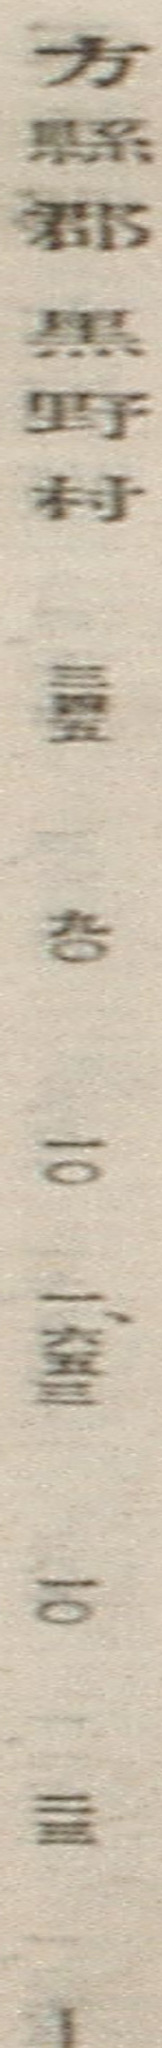方県郡黒野村三四五九〇一〇一、六五三一〇二三―

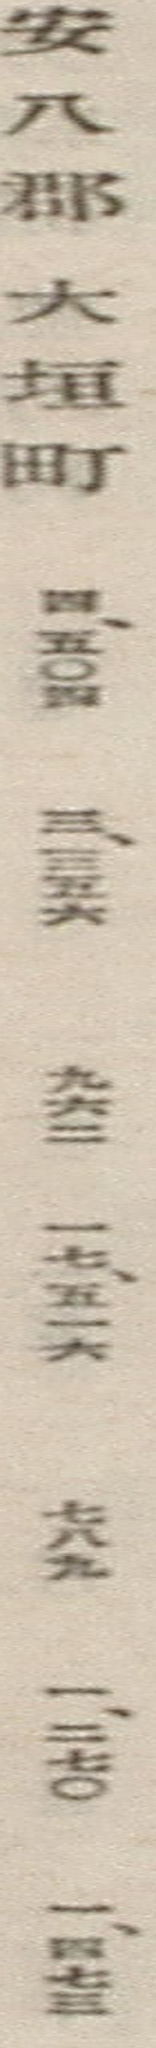安八郡大垣町四、五〇四三、三五六九六二一七、五一六七八九一、二七〇一、四七三
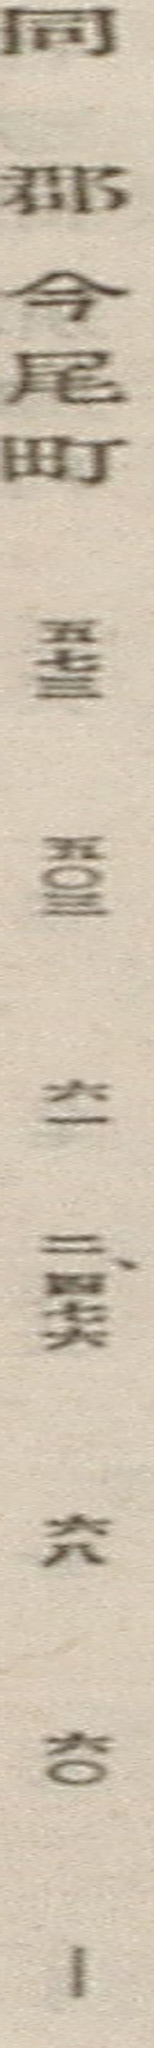同郡今尾町五七三五〇三六一二、四七六六八六〇―
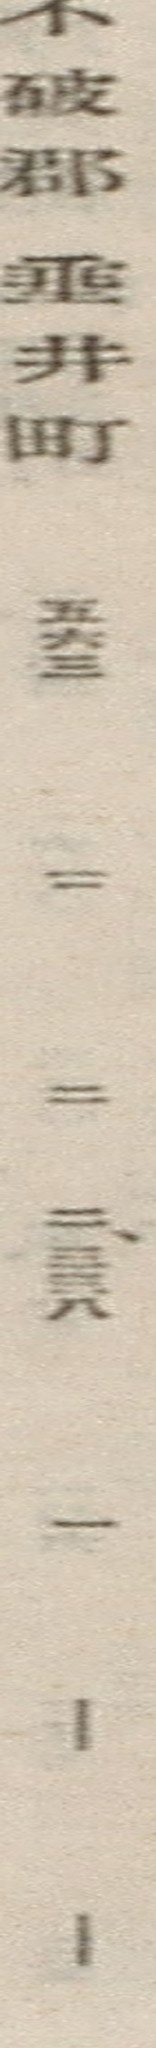不破郡垂井町五六三二二二、三三八一――
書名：愛知岐阜福井三県　大地震見聞録（内題）
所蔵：東京大学地震研究所図書室 Earthquake Research Institute Library, The University of Tokyo, JAPAN
